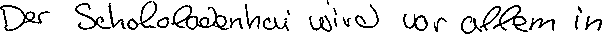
Der Schokoladenhai wird vor allem in
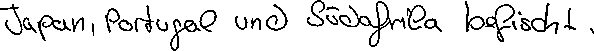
Japan, Portugal und Südafrika befischt,
